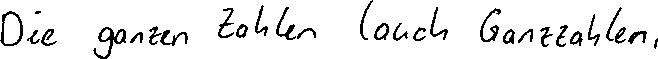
Die ganzen Zahlen (auch Ganzzahlen,
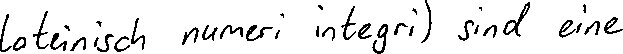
lateinisch numeri integri) sind eine
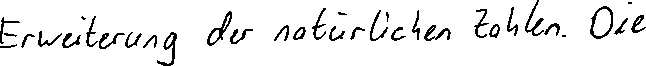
Erweiterung der natürlichen Zahlen. Die
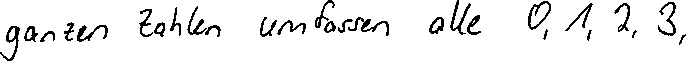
ganzen Zahlen umfassen alle 0, 1, 2, 3,
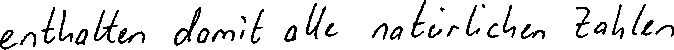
enthalten damit alle natürlichen Zahlen
